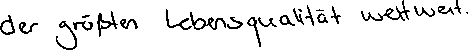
der größten Lebensqualität weltweit.
